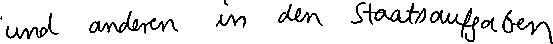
und anderen in den Staatsaufgaben
